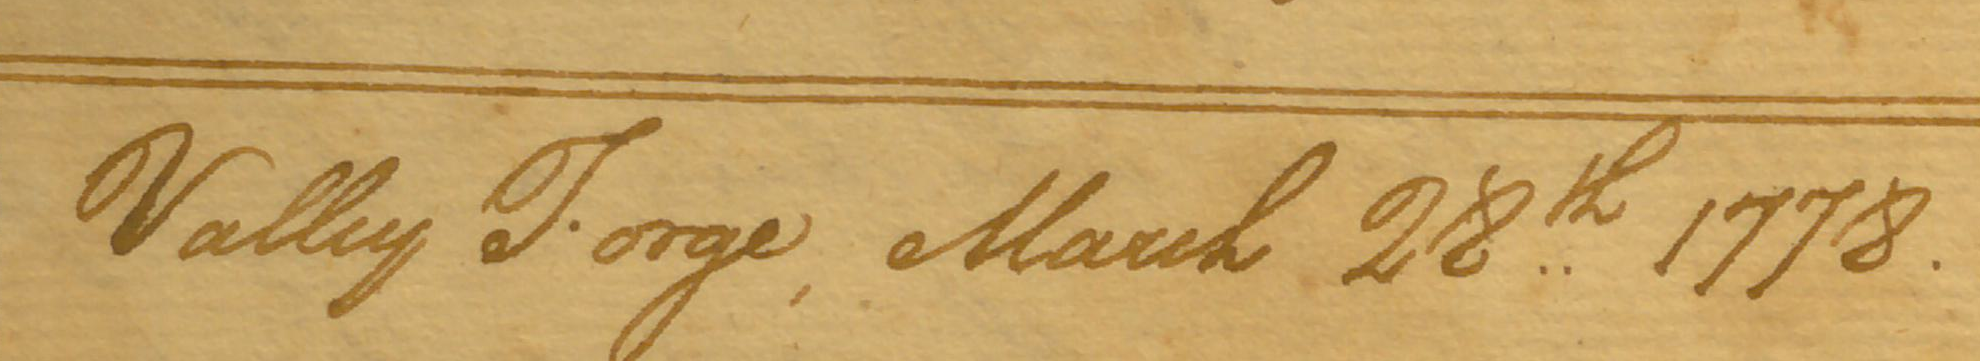Valley Forge, March 28^th. 1778.
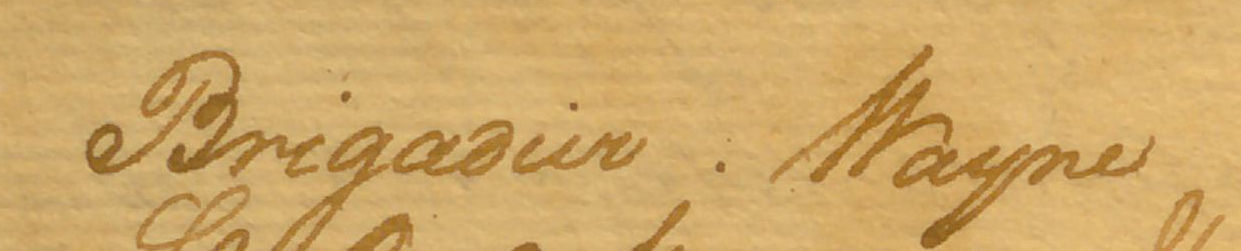Brigadier. Wayne
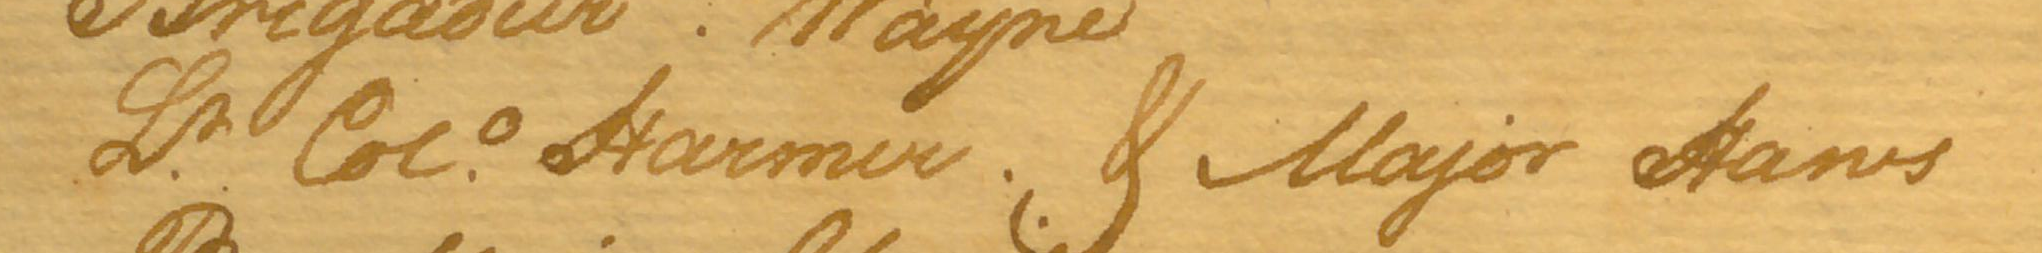L^t. Col^o. Harmer. & Major Haws
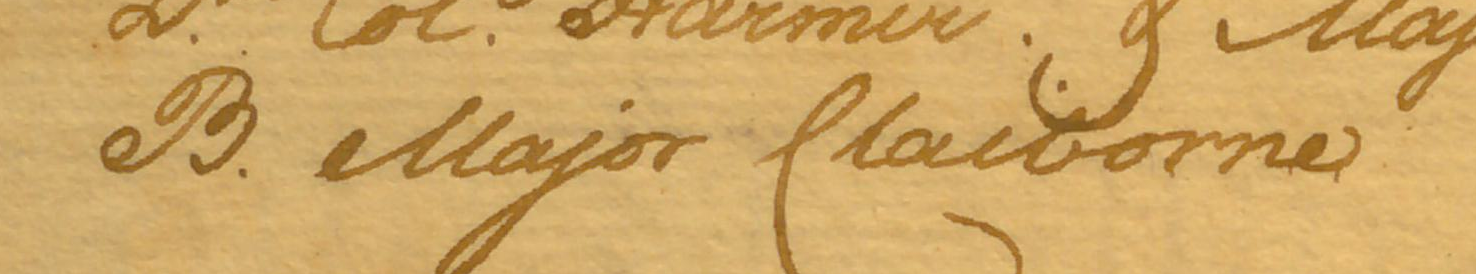B. Major Claiborne
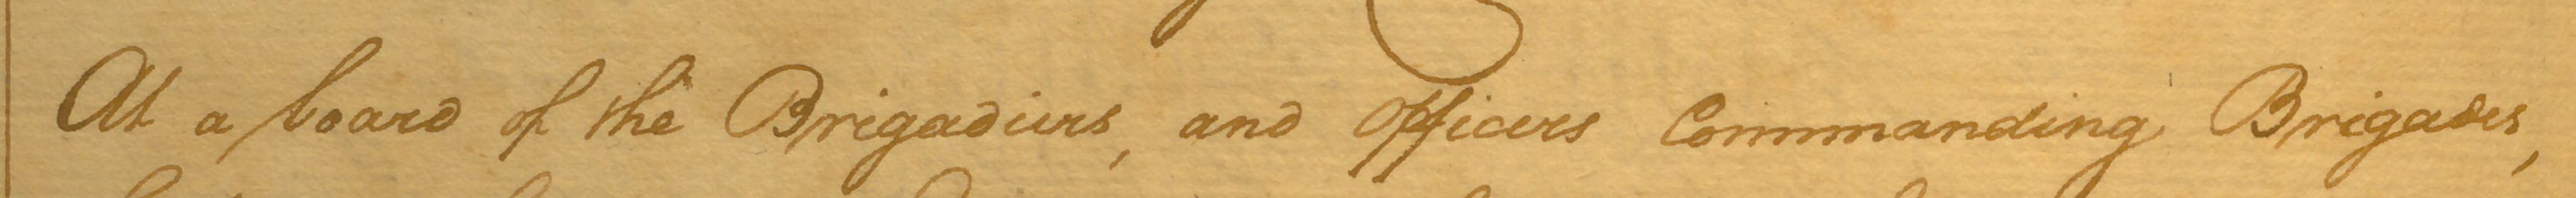At a board of the Brigadiers, and officers Commanding Brigades,
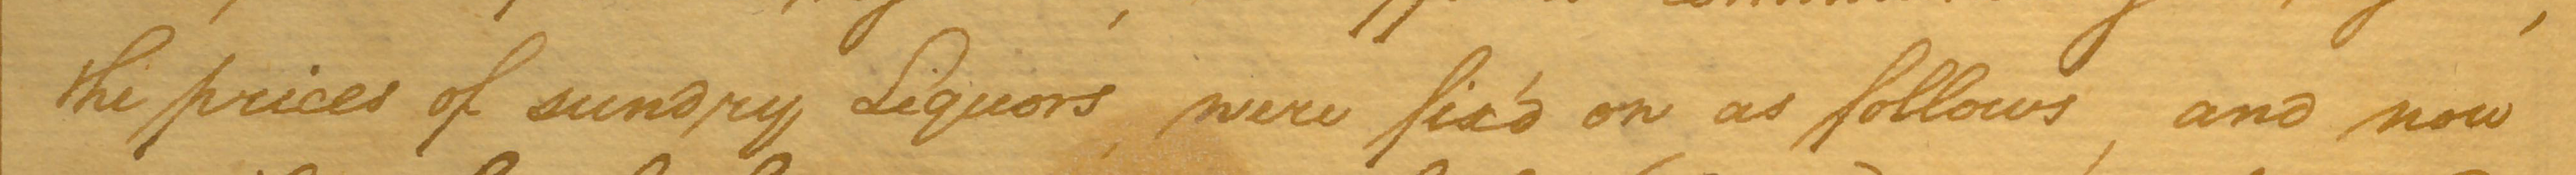the prices of sundry Liquors were fix'd on as follows, and now
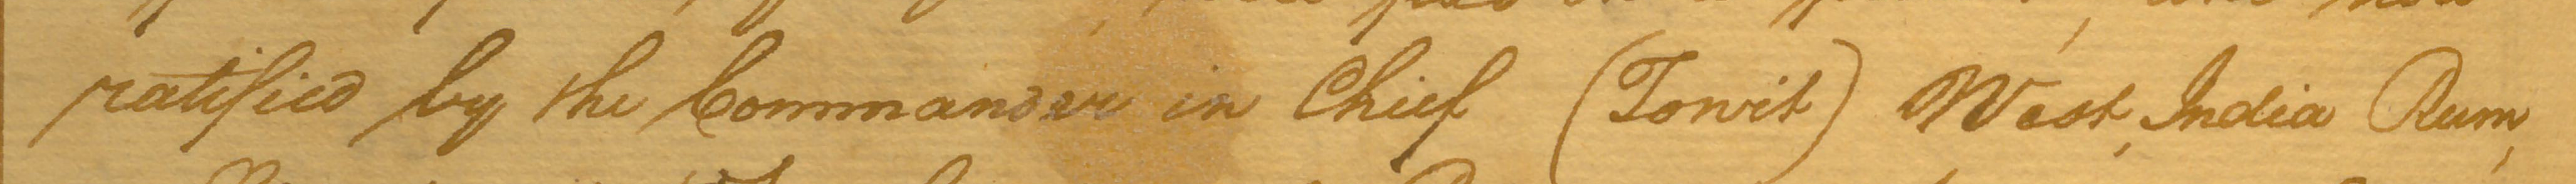ratified by the Commander in Chief (To wit) West, India Rum,
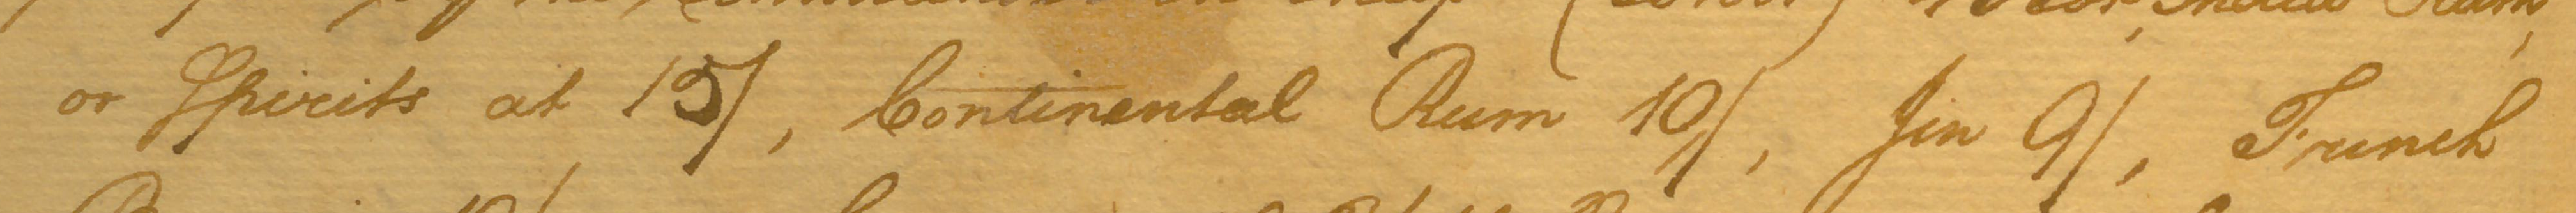or spirits at 15s, Continental Rum 10 s, Jin 9s, French
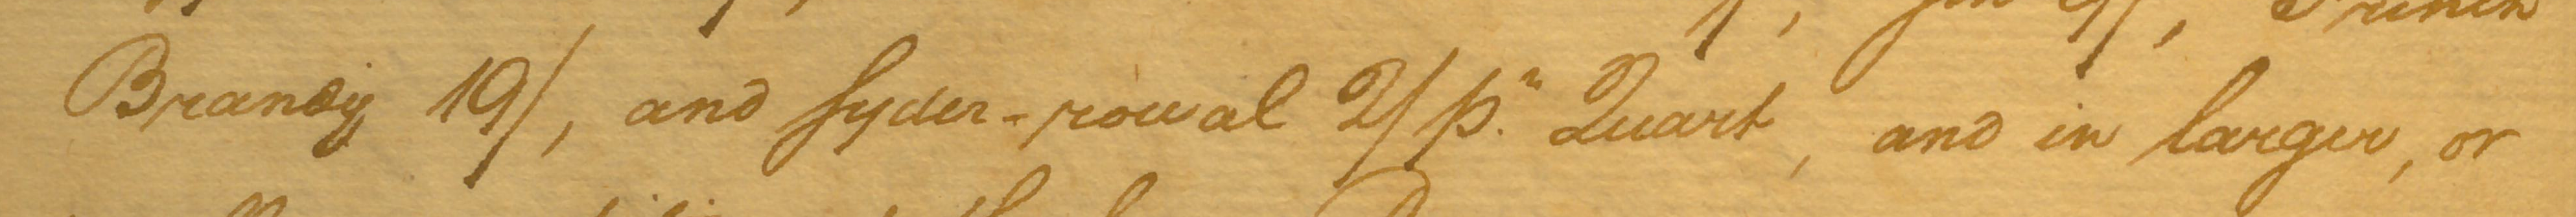Brandy 19s, and syder-roual 2s p^r. Quart, and in larger, or
